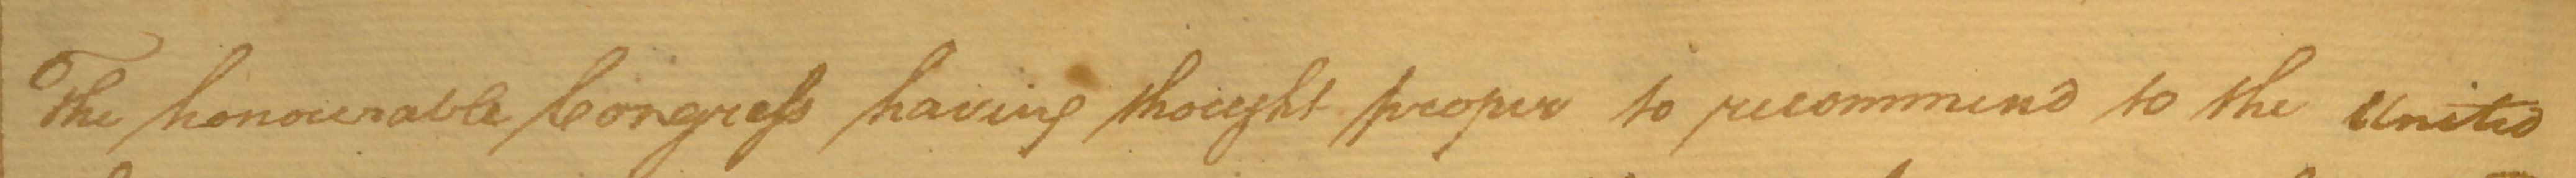The honourable Congress having thought proper to recommend to the United
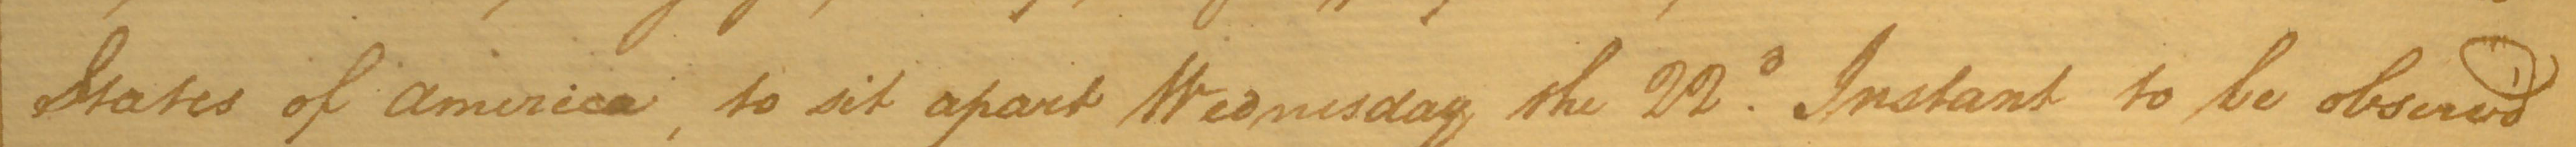States of America to sit apart Wednesday the 22^d. Instant to be observ'd
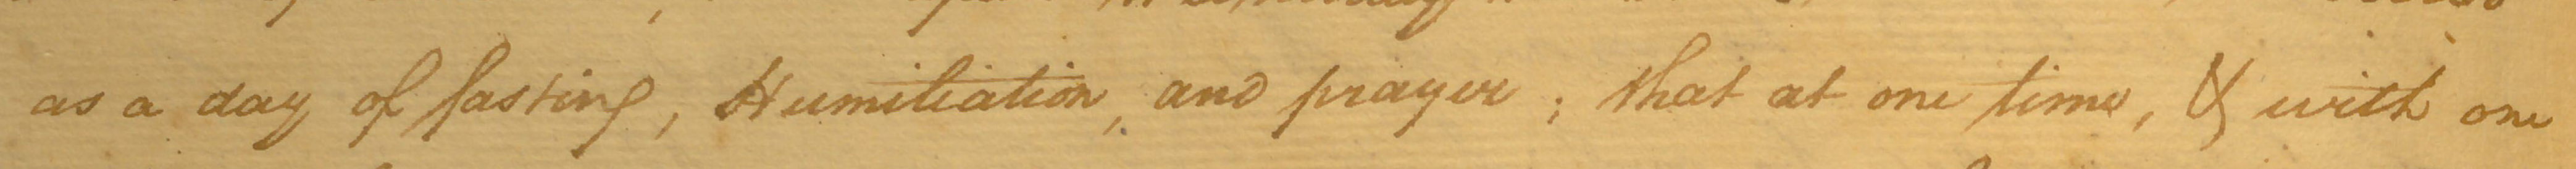as a day of fasting, Humiliation, and prayer; that at one time, & with one
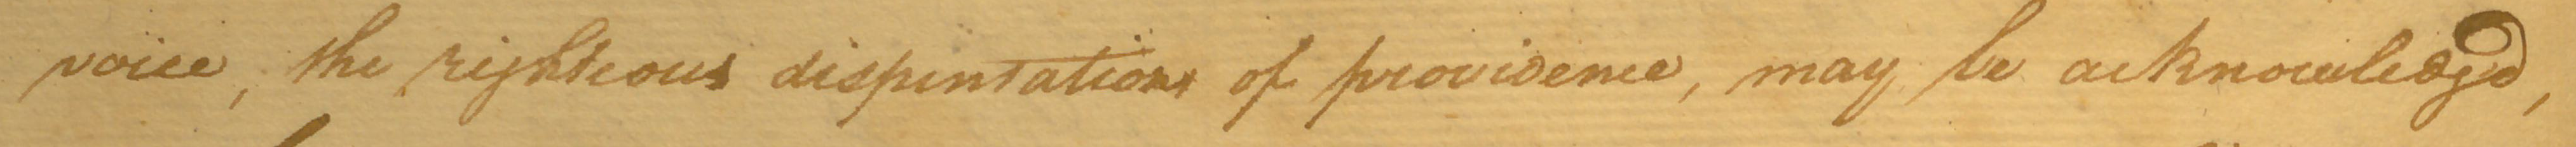voice, the righteous dispensations of providence, may be acknowledged,
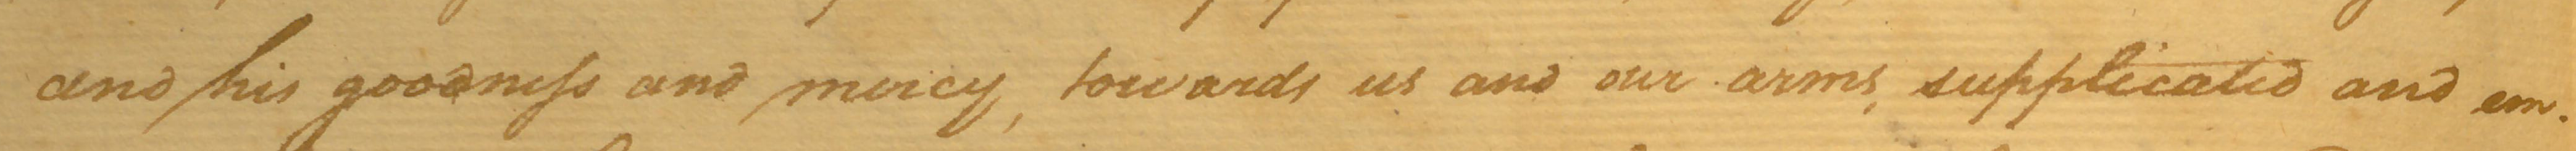and his goodness and mercy towards us and our arms supplicated and em-
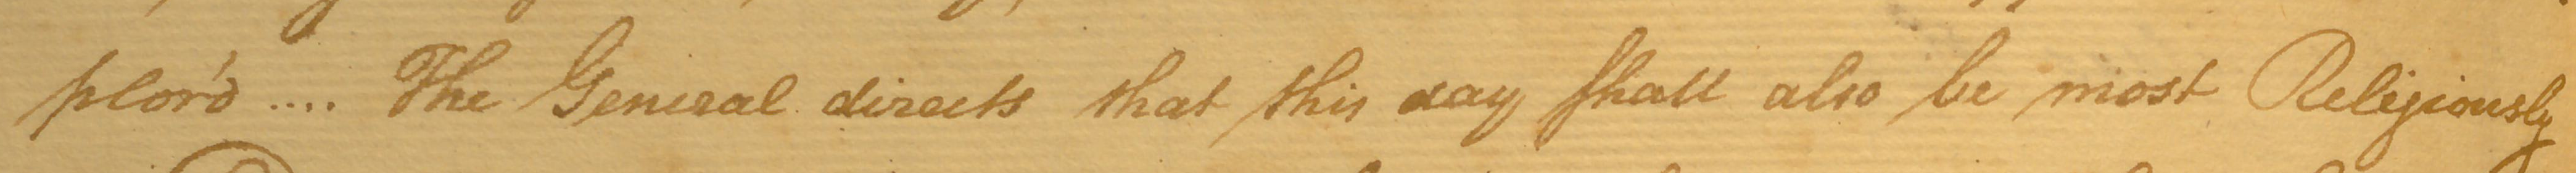plor'd.... The General directs that this day shall also be most Religiously
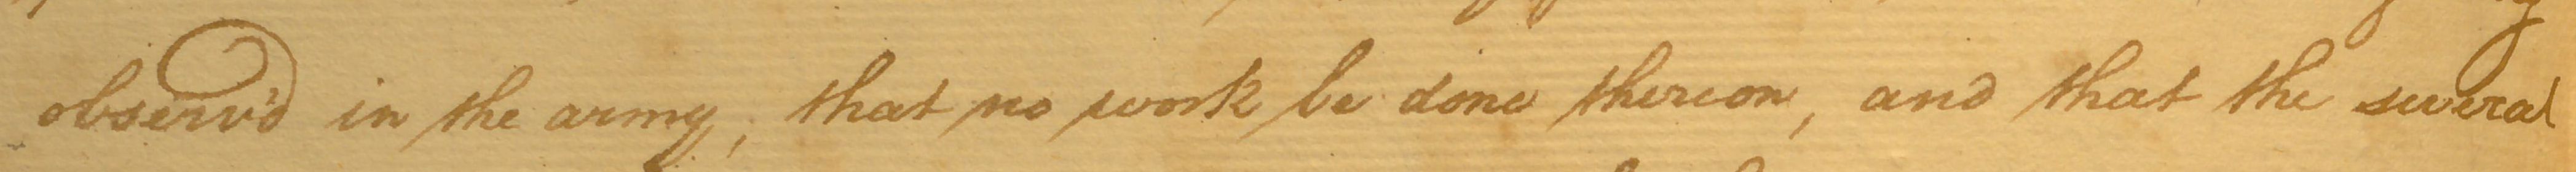observ'd in the army, that no work be done thereon, and that the several
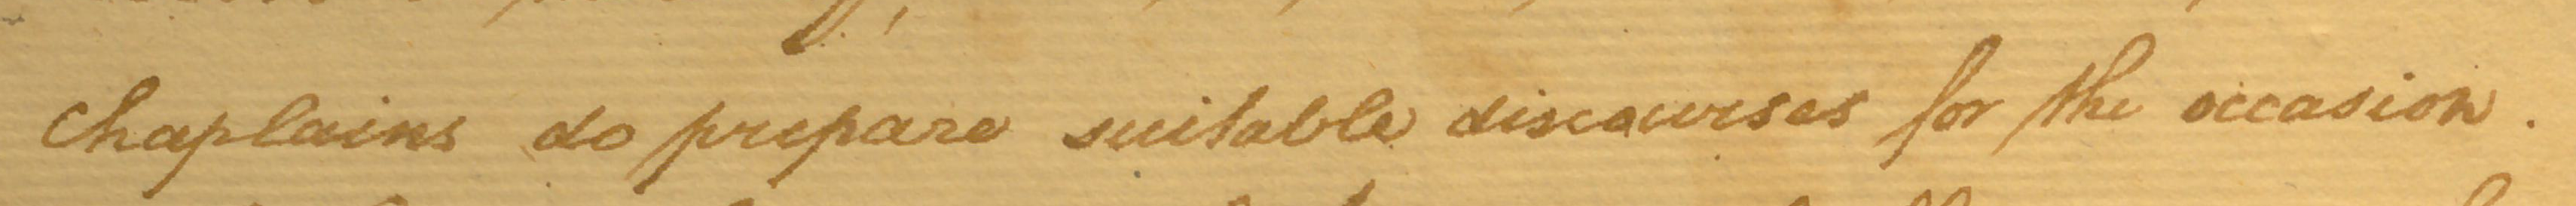chaplains do prepare suitable discourses for the occasion.
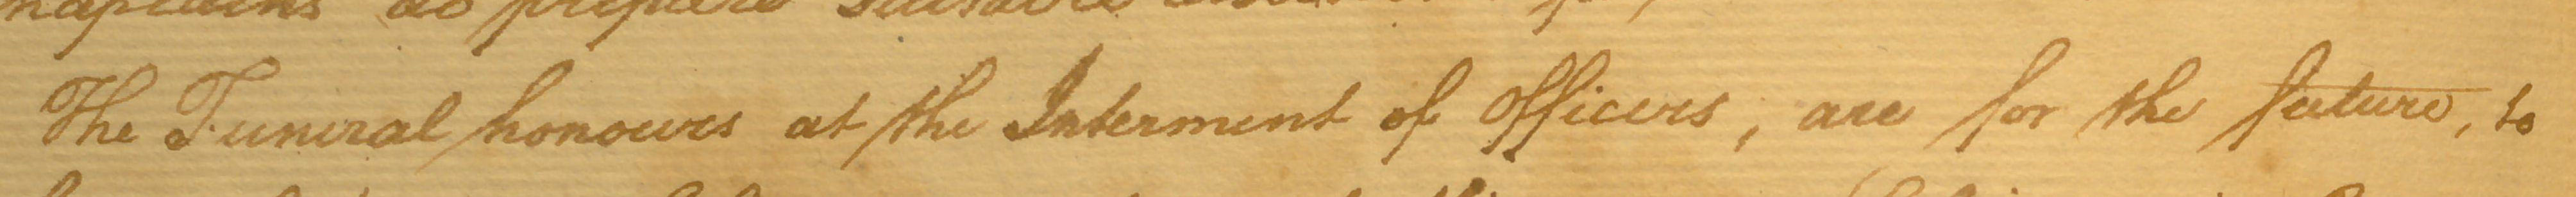The Funeral honours at the Interment of Officers, are for the future, to
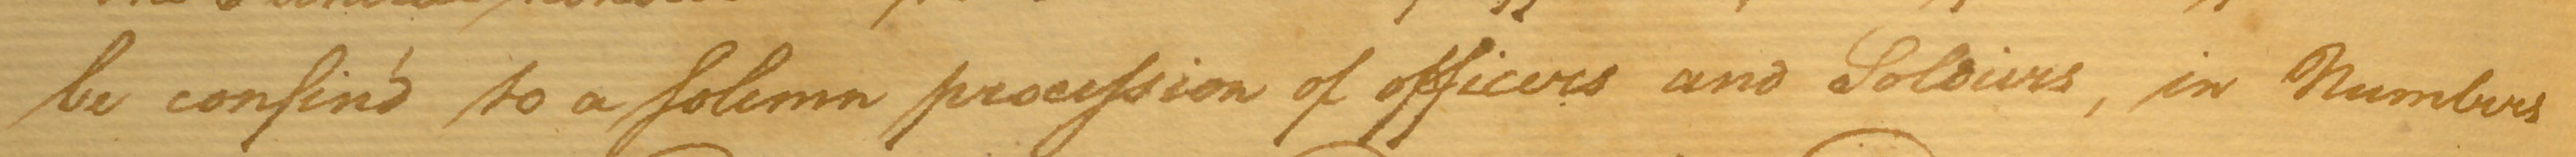be confin'd to a solemn procession of officers and soldiers, in numbers
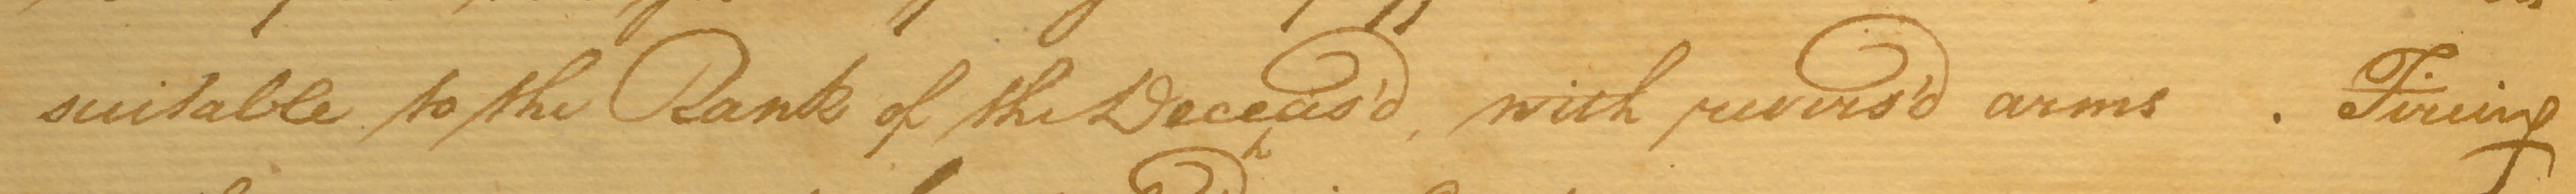suitable to the Rank of the Deceas'd, with revers'd arms. Firing
